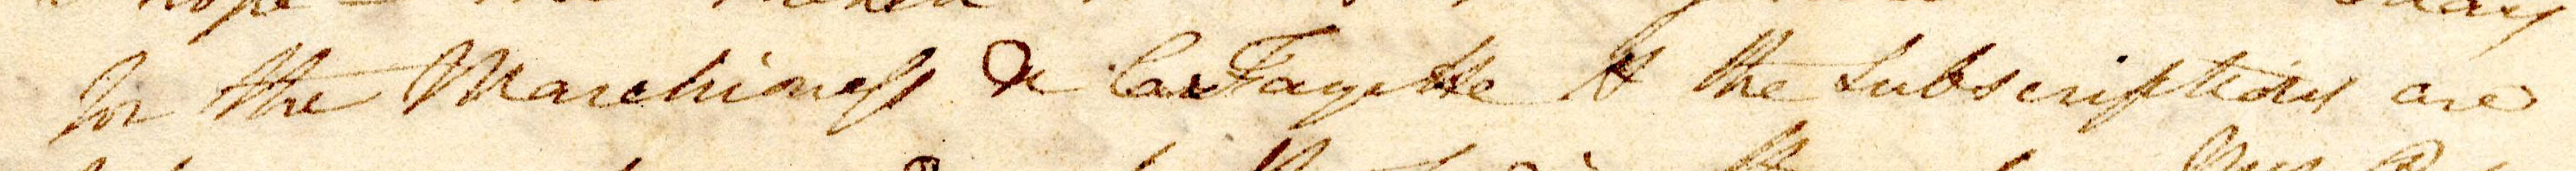for the Marchiness & la Fagette & the Subscriptions are
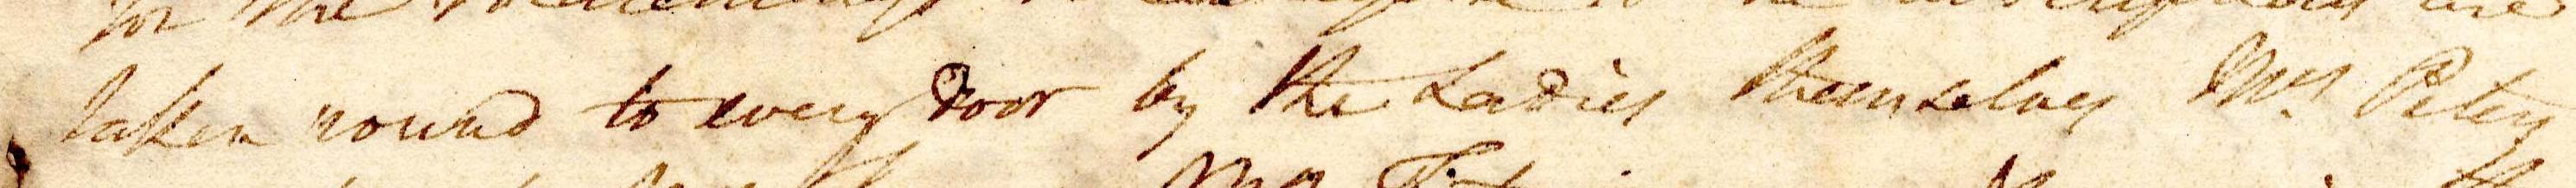taken round to every door by the Ladies themselves M^rs. Petey
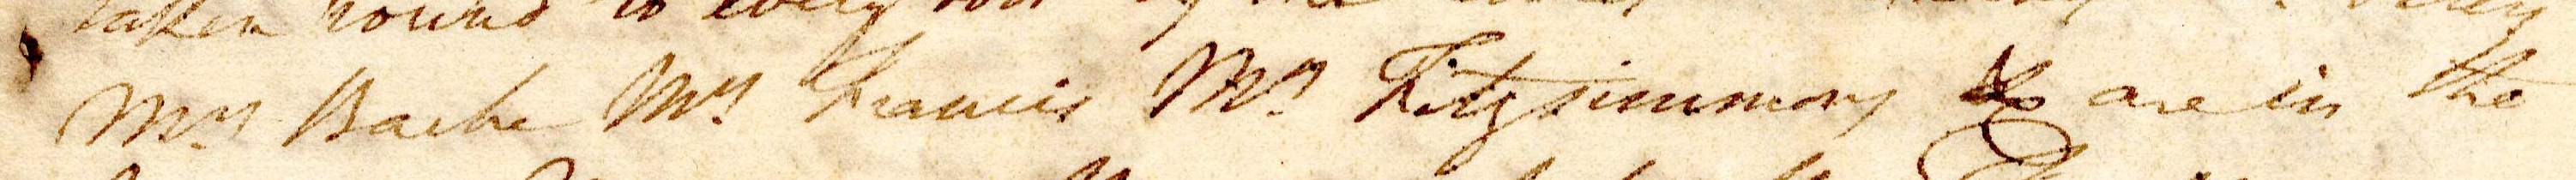M^rs. Backe M^rs. Travis M^r. Fitzsimmons & are in the
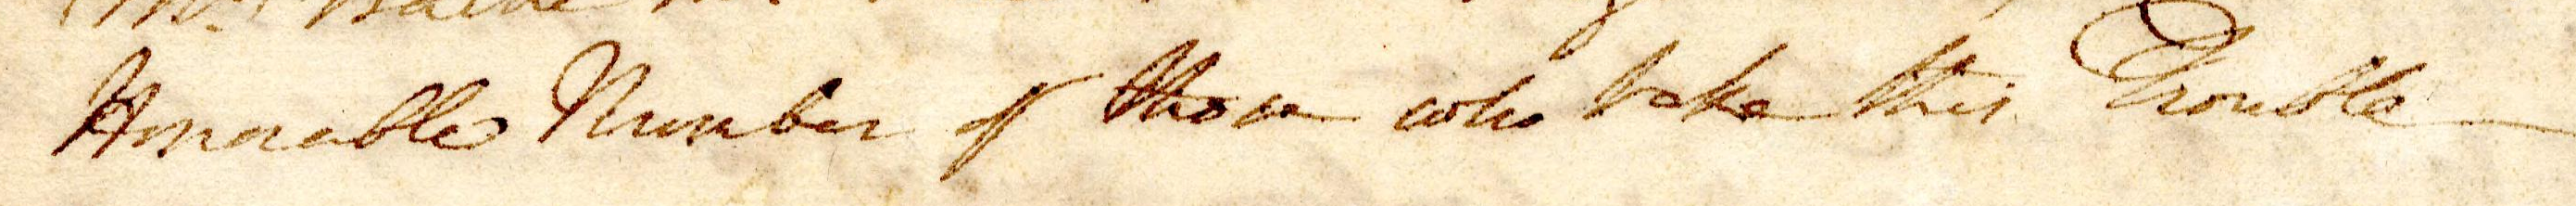Honorable Number of those who take this Trouble-
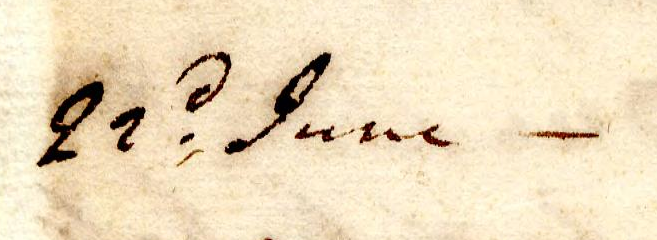22^d. June
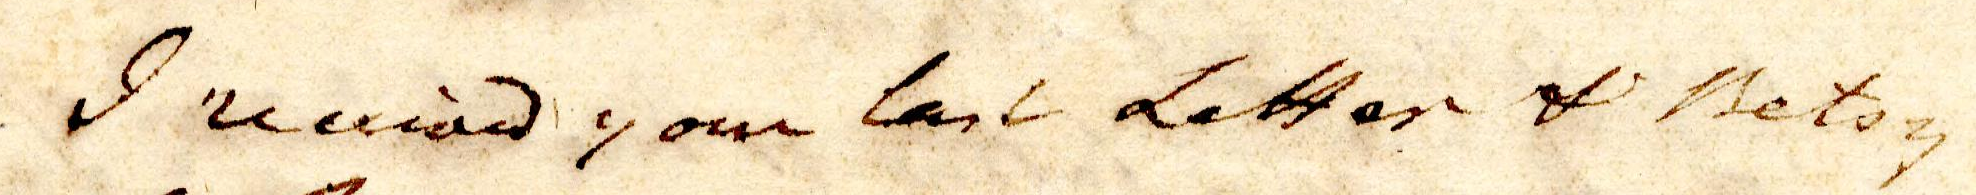I received your last Letter & Betsy
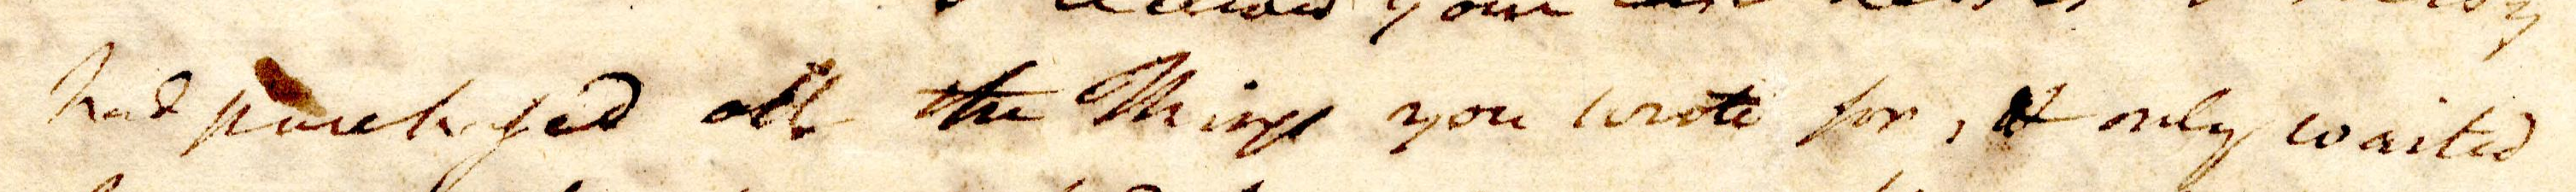had packed all the Things you wrote for, & only waited
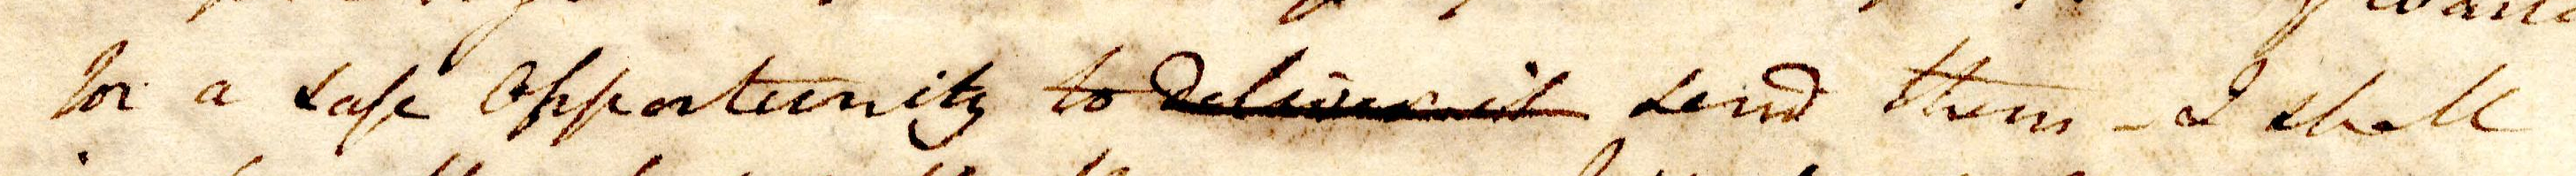for a safe opportunity to deliver it send them. I shall
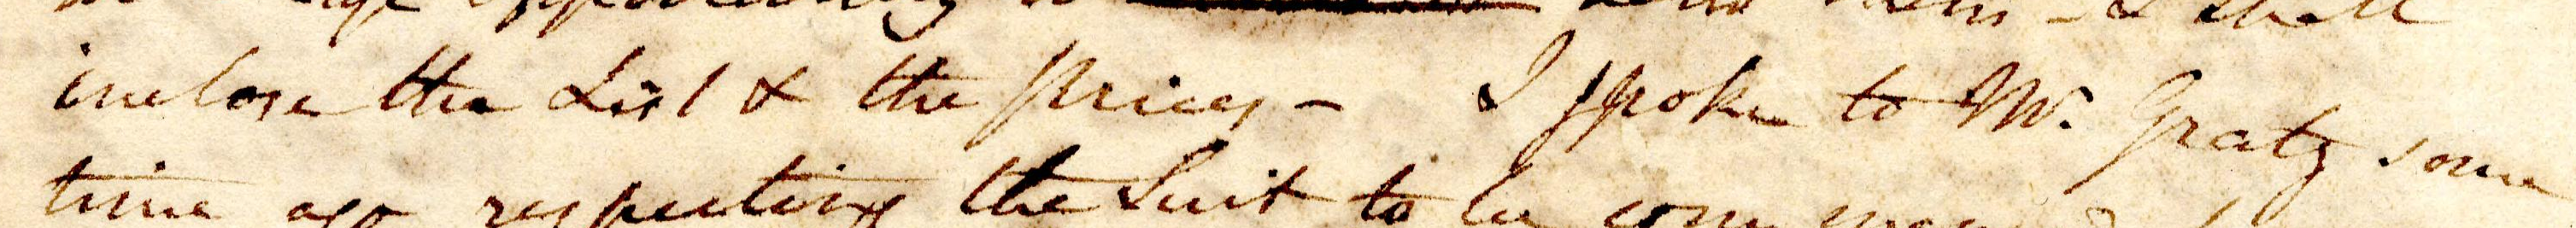inclose the List & the Prices- I spoke to M^r. Gratz some
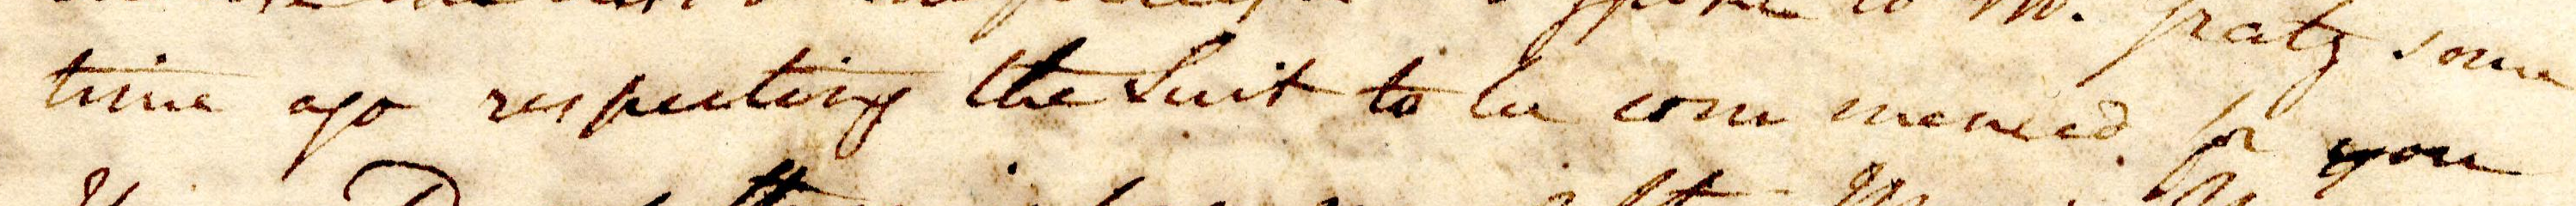time ago respecting the suit to be commenced for you
